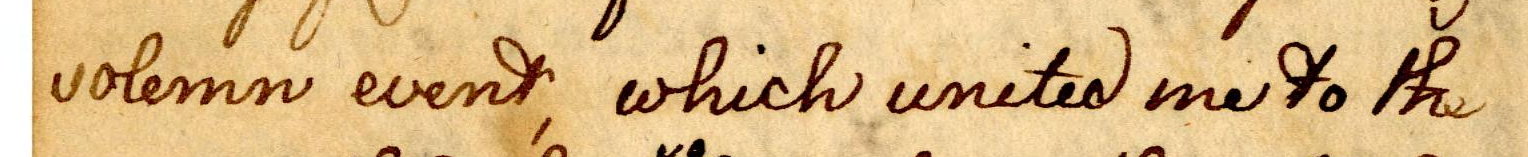solemn event, which united me to the
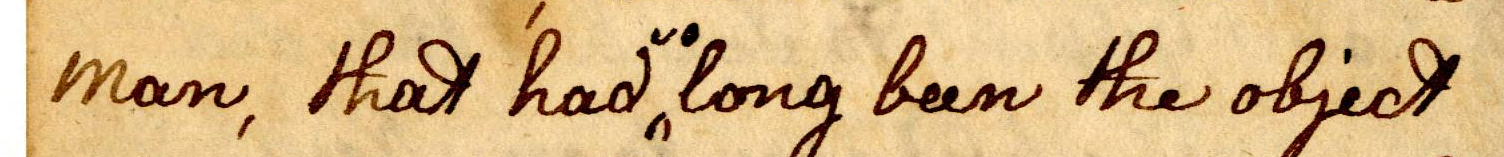man that had ^so long been the object
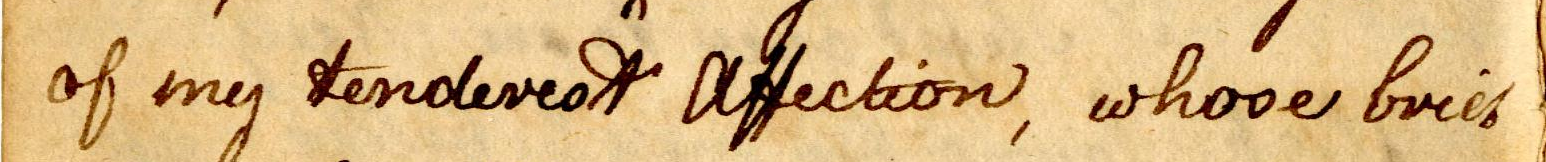of my tenderest Affection, whose brief
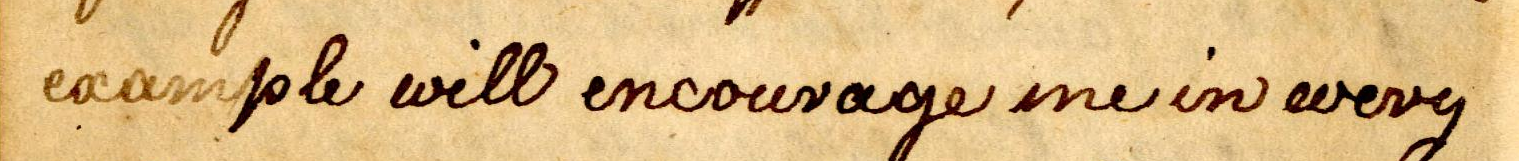example will encourage me in every
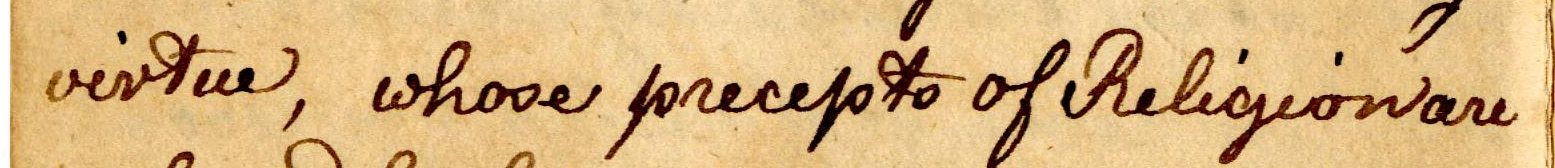virtue, whose precepts of Religion are
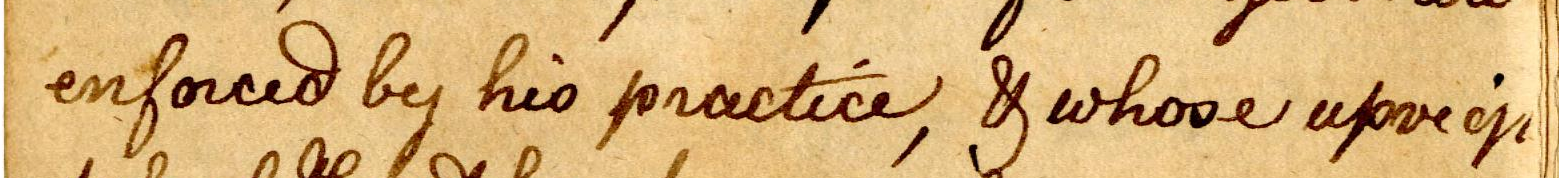enforced by his practice, & whose uprig
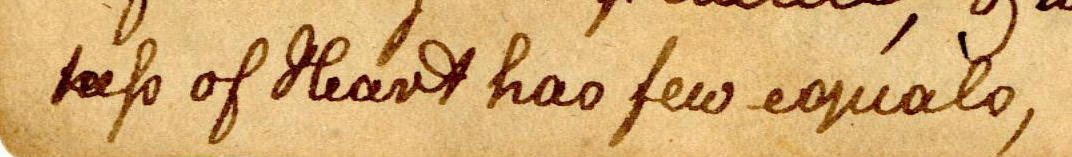tnss of Heart has few equals,
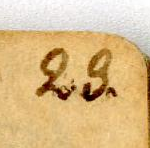23
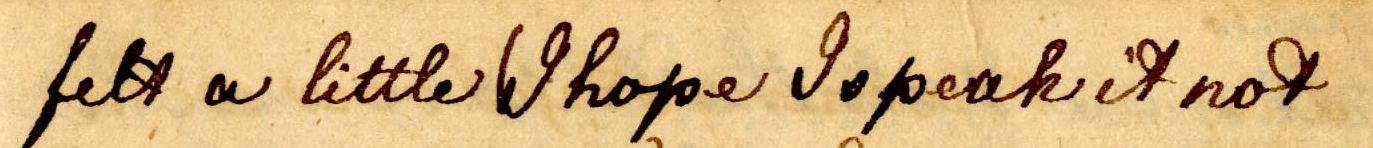felt a little (I hope I speak it not
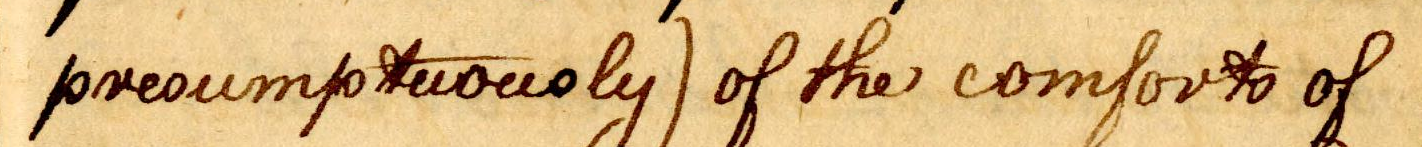presumptuously) of the comforts of
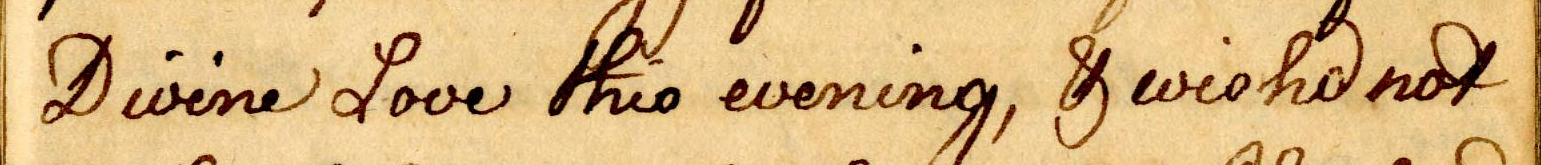Divine Love this evening, & wishd not
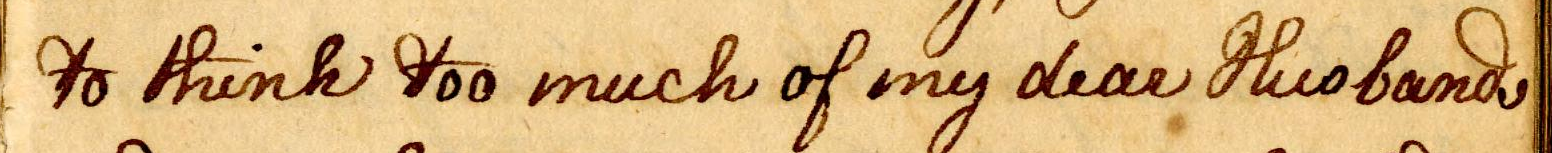to think too much of my dear Husbands
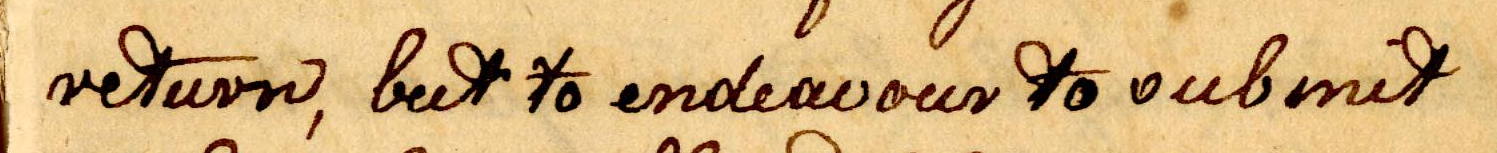return, but to endeavour to submit
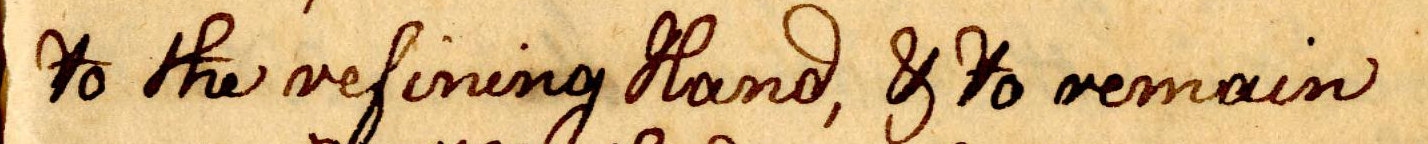to the refining Hand, & to remain
